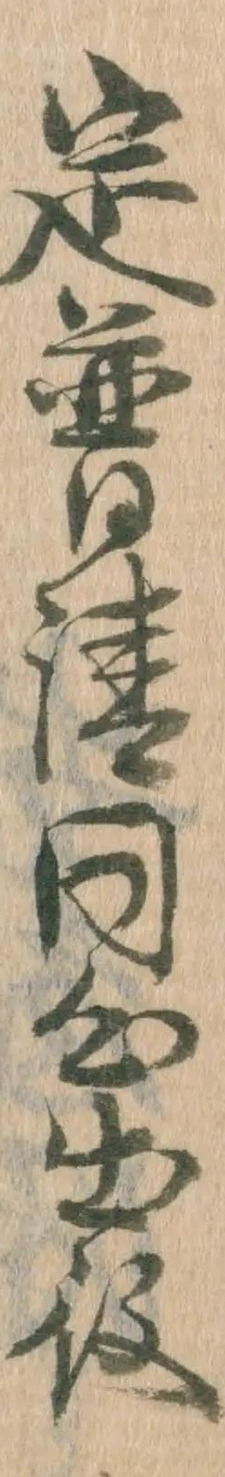定普請同心出役
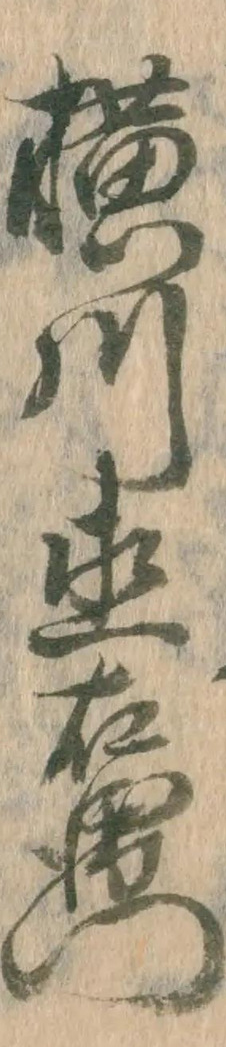横川直右衛門
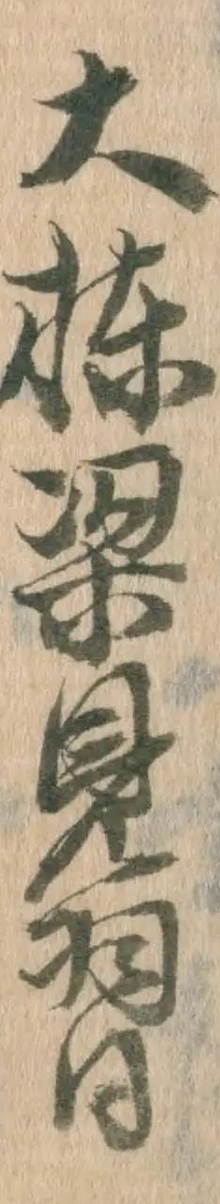大棟梁見習
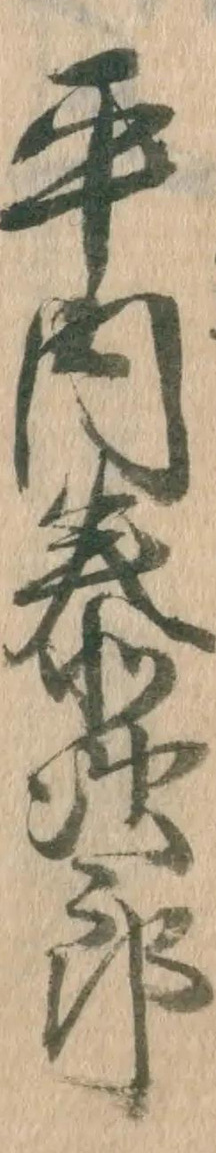平内泰次郎
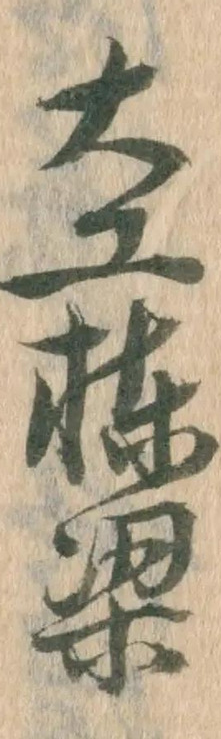大工棟梁
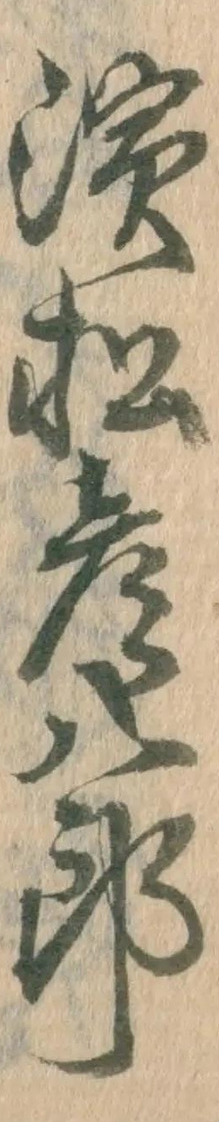浜松彦八郎

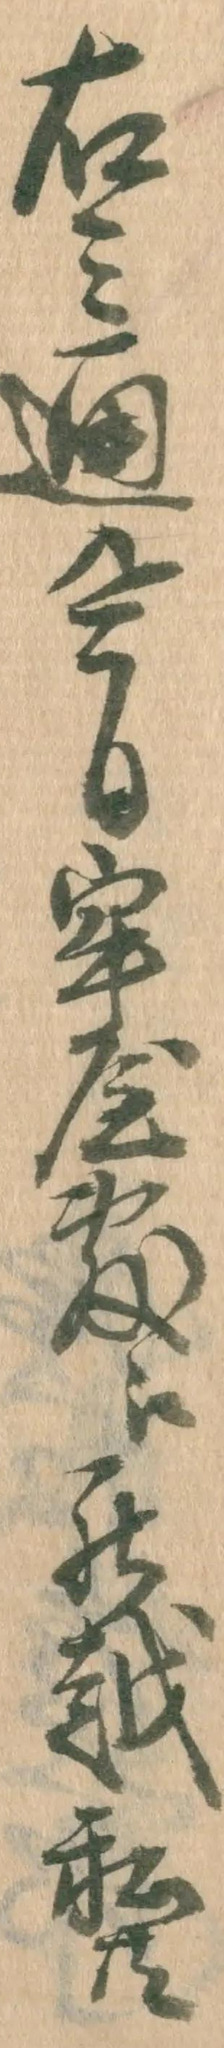右之通今日牢屋敷え罷越私共
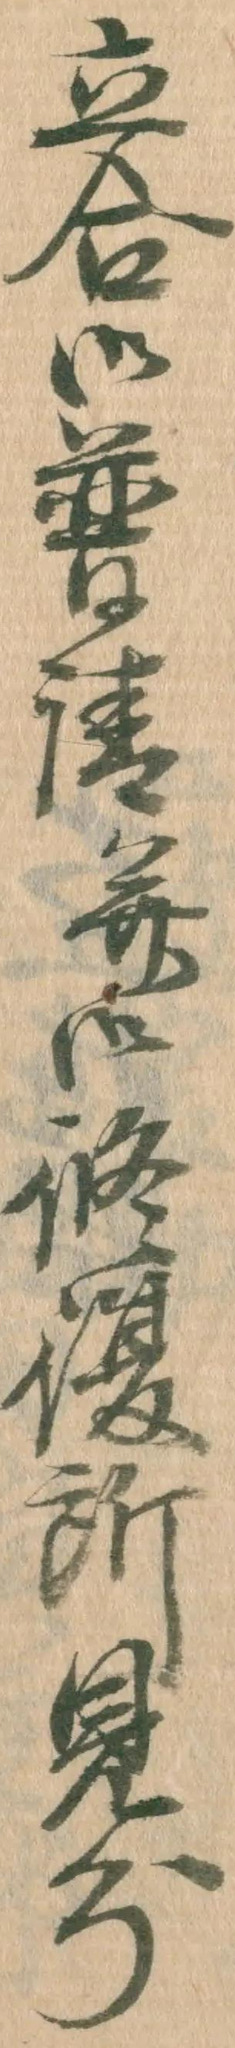立合御普請幷御修復所見分
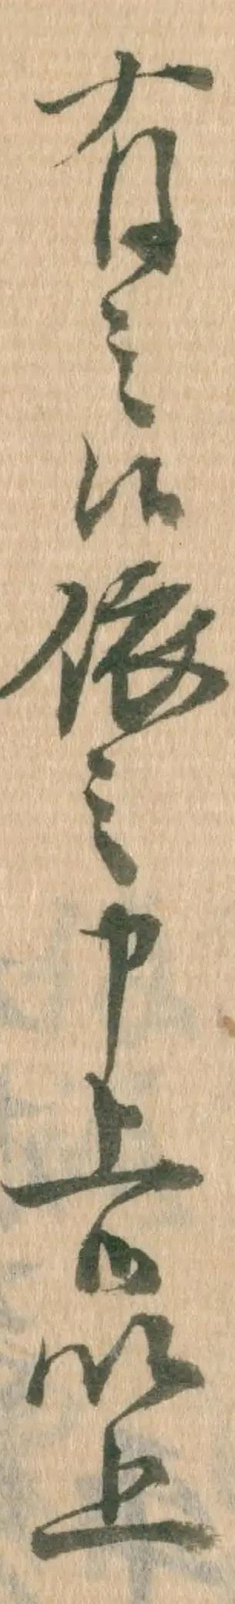有之候依之申上候以上
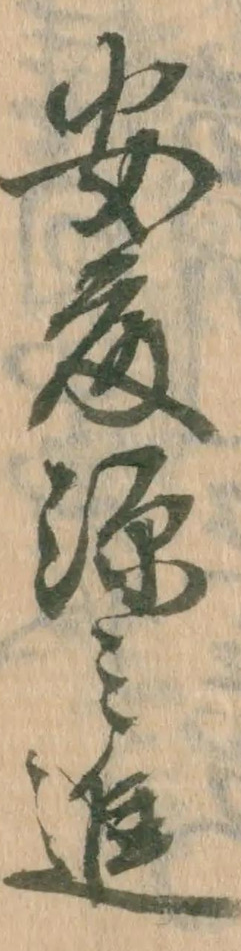安藤源之進
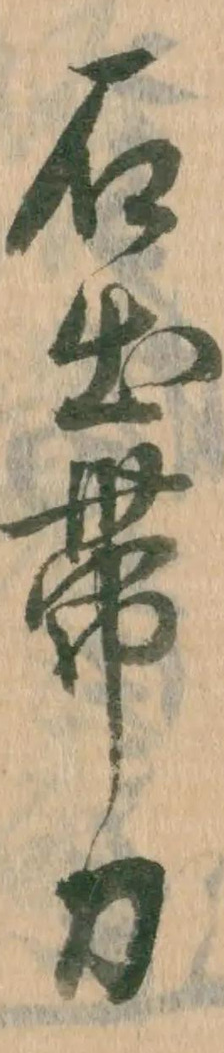石出帯刀
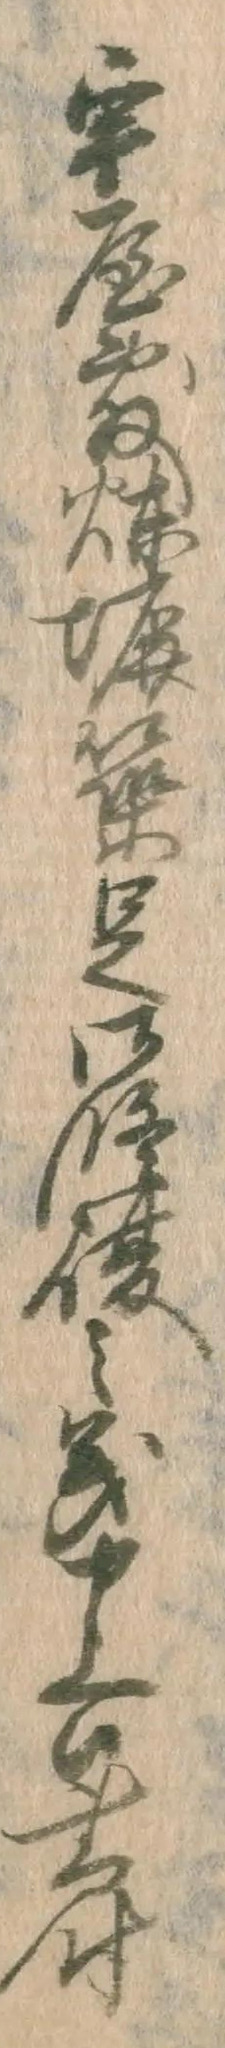│牢屋敷煉塀築足御修復之義申上候書付
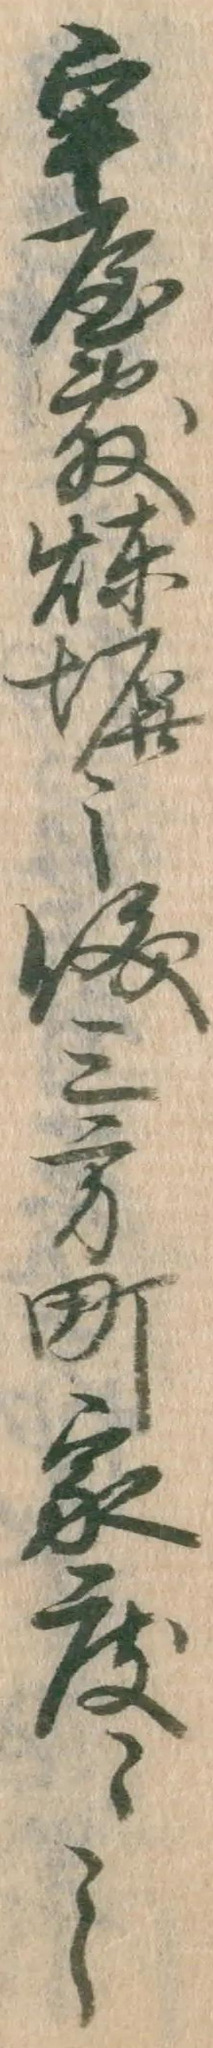牢屋敷煉塀之儀三方町家度〻之
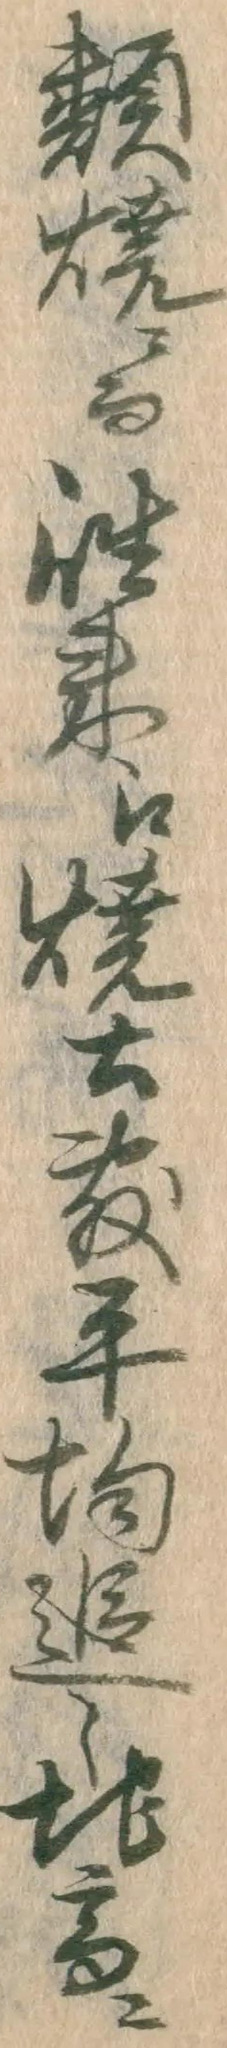類焼ニて往来え焼土敷平均追〻地高ニ

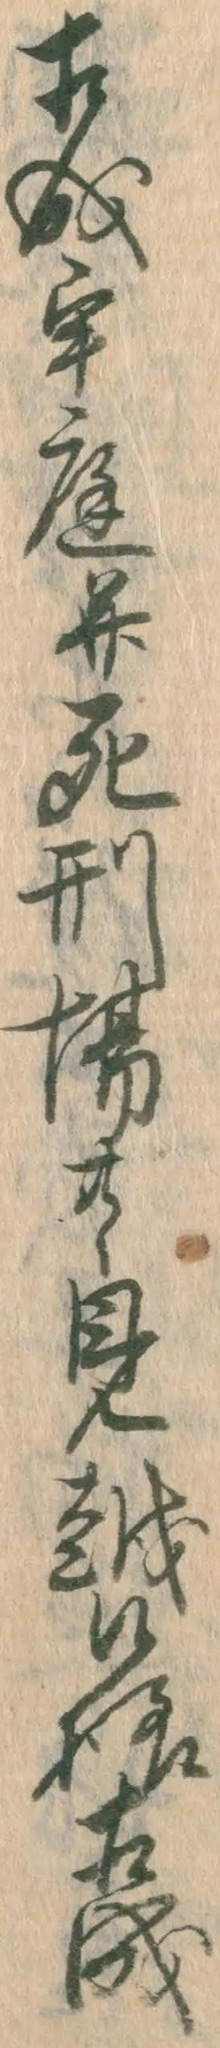相成牢庭幷死刑場共〻見越候様相成
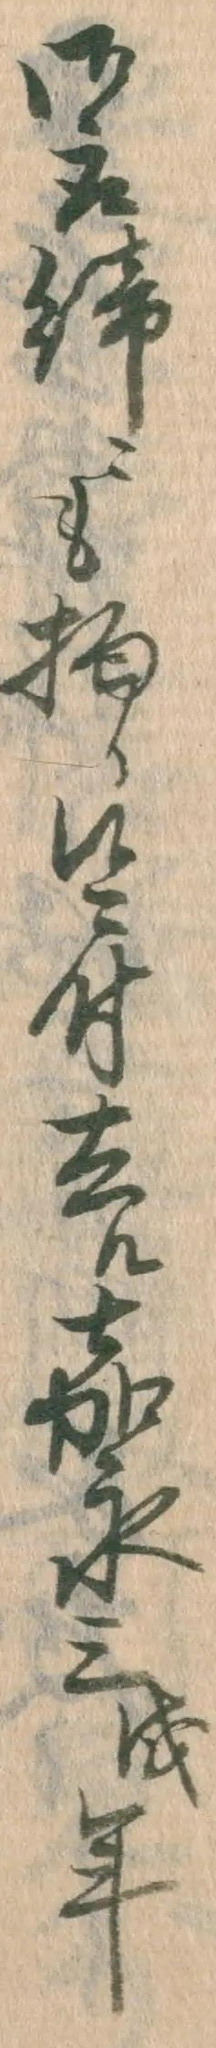御取締ニも拘り候ニ付去ル嘉永三戌年
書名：七十冊物類集 71巻. [44] 四十三 牢屋敷御普請御修覆地震ニ付骨折候牢屋掛御褒美之部
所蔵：国立国会図書館 National Diet Library, JAPAN
